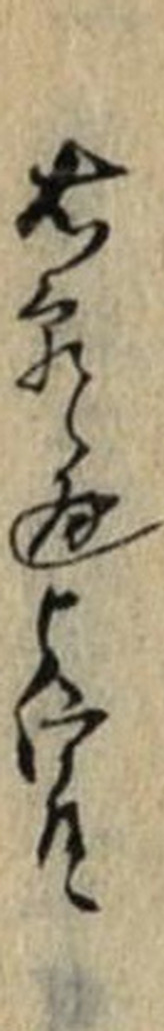右願之通被仰付候
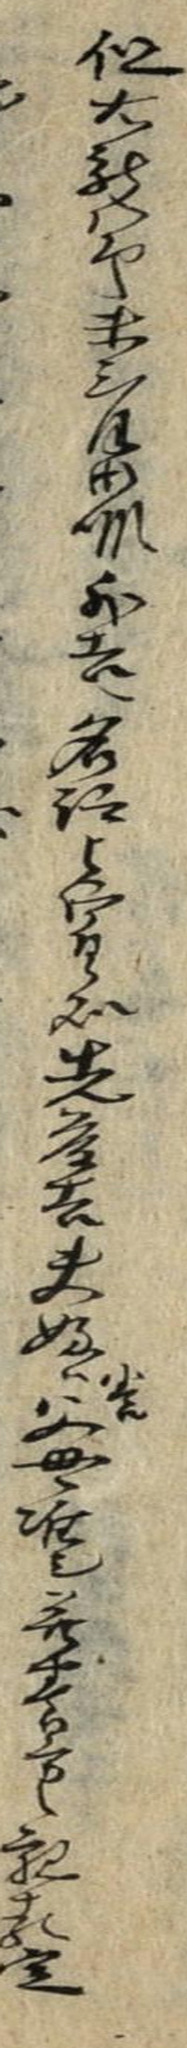但右新八郎未三月御暇外吉へ名跡被仰付候処先藤吉夫婦は養父母に准し并養方之親類定
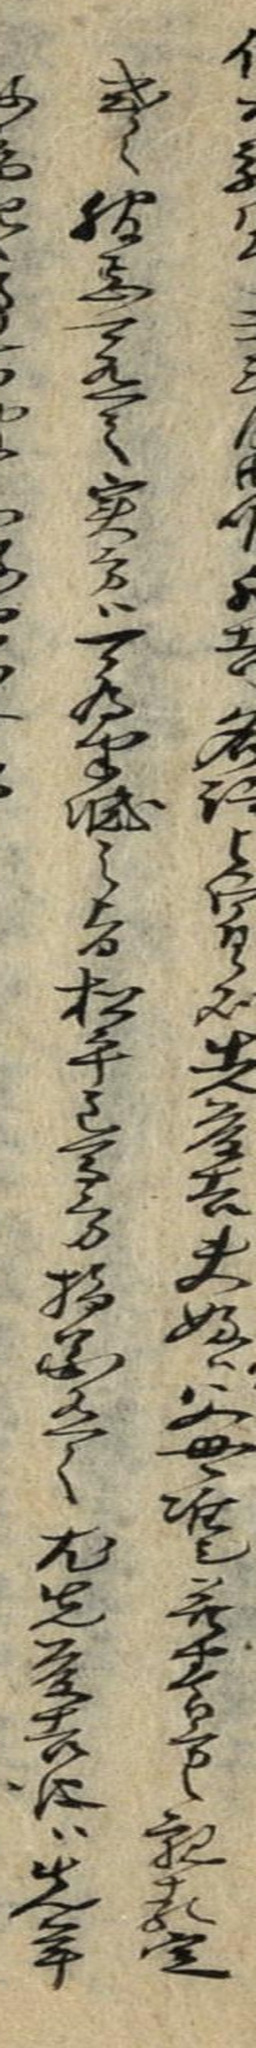式之服忌可有之実方は可為半減之旨松平主馬方指図有之尤先藤吉儀は先年
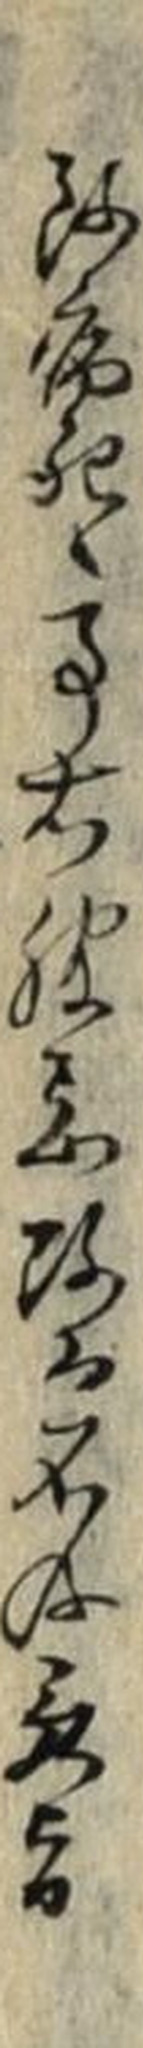致病死候事右服忌改而不及受旨
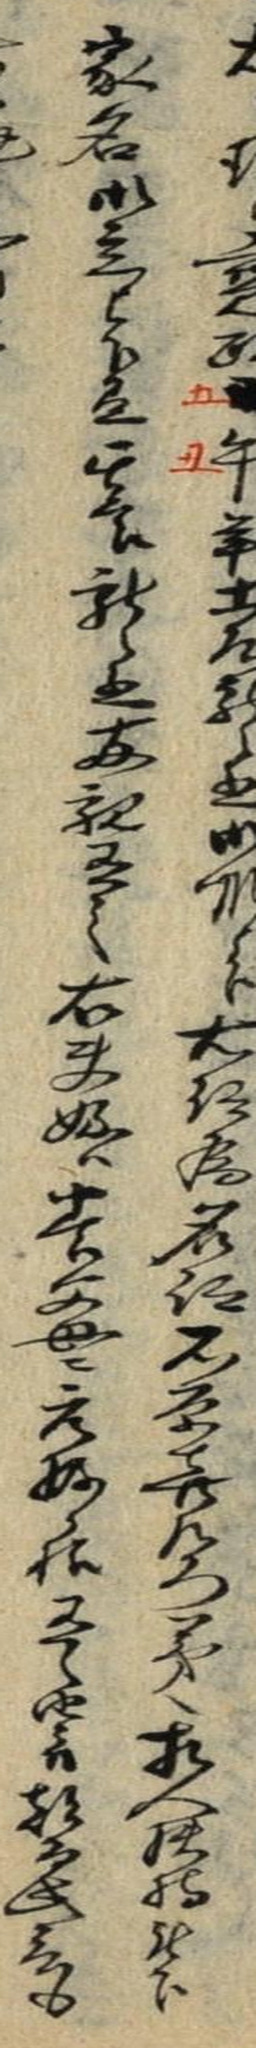家名御立被下置其節新之丞両親有之右夫婦は養父母に取扱候様有之由に付都而此度も
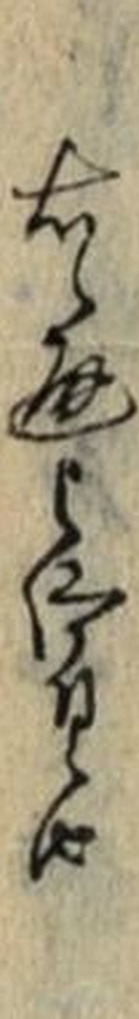右之通被仰付候由
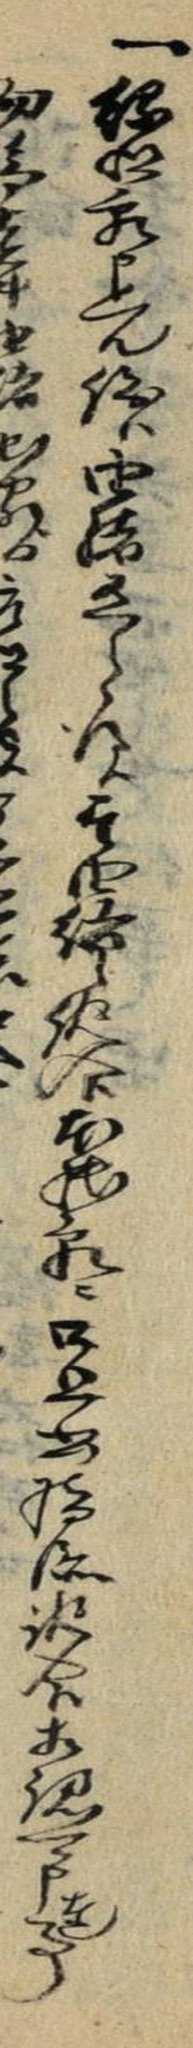一縁組願申上る儀は由緒有之候得は其由緒之訳合本紙願に口上書指添訳合相認可申達事
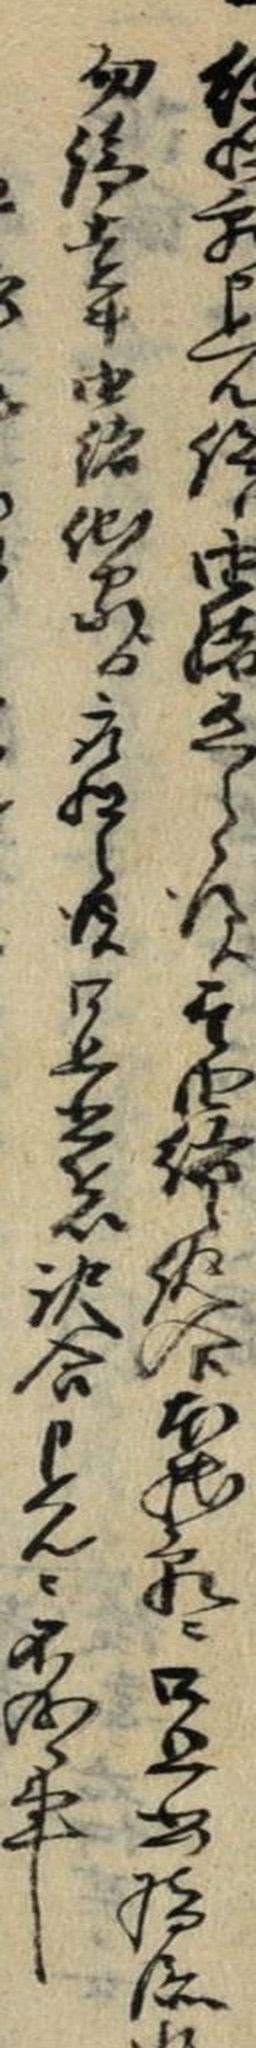勿論遠き由緒他家ゟ取組之儀は口上書を以訳合申上るに不及候事
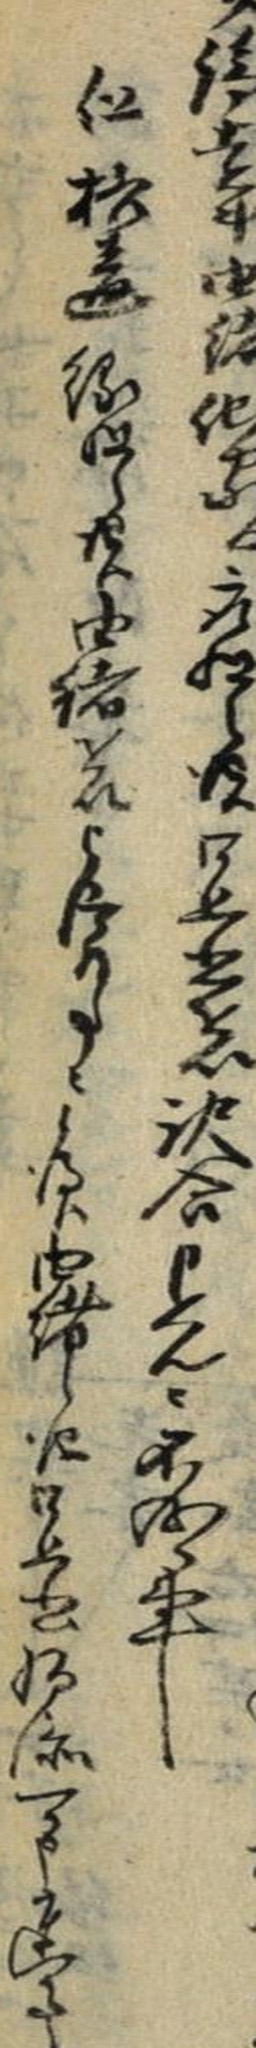但格違縁組之儀は由緒を以被仰付事に候得は由緒之儀口上書指添可申達事
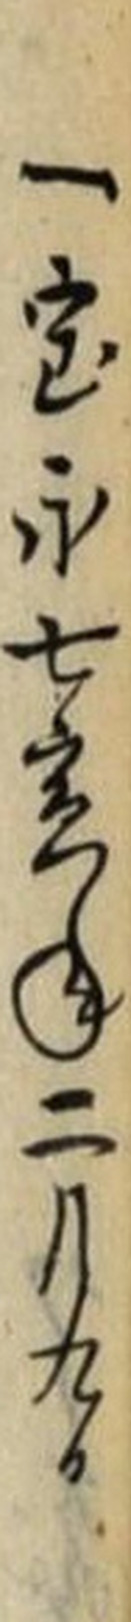一宝永七寅年二月九日
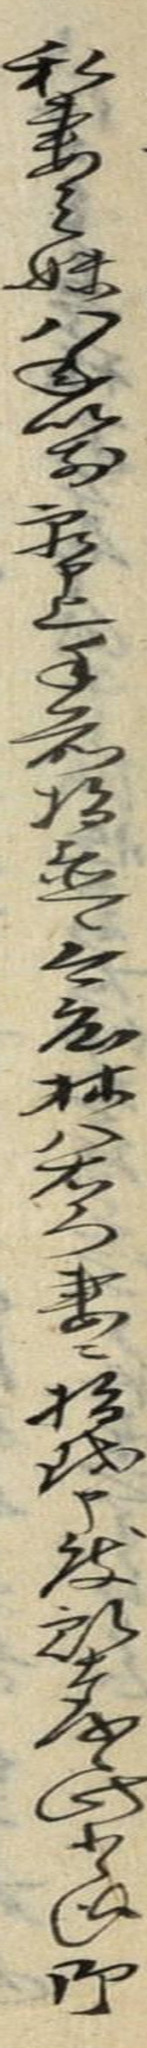私妻之妹八年以前願申上手前指置候今度林八右衛門妻に指越申度願奉存候此等趣御
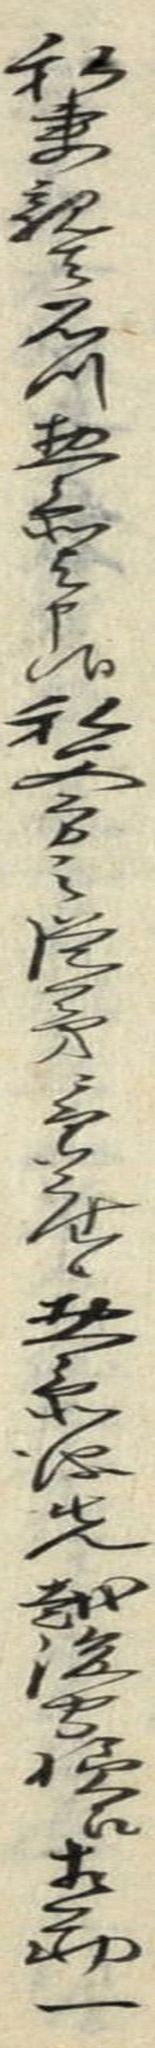私妻親は石川惣兵衛と申候私父方之従弟に而御座候惣兵衛儀先越後守様え相勤一
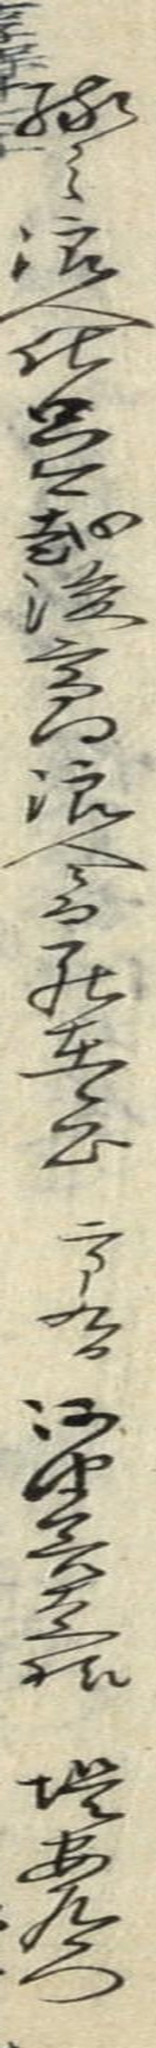統之浪人仕只今越後高田浪人に而罷在候以上二月九日河津善太夫様堤安左衛門
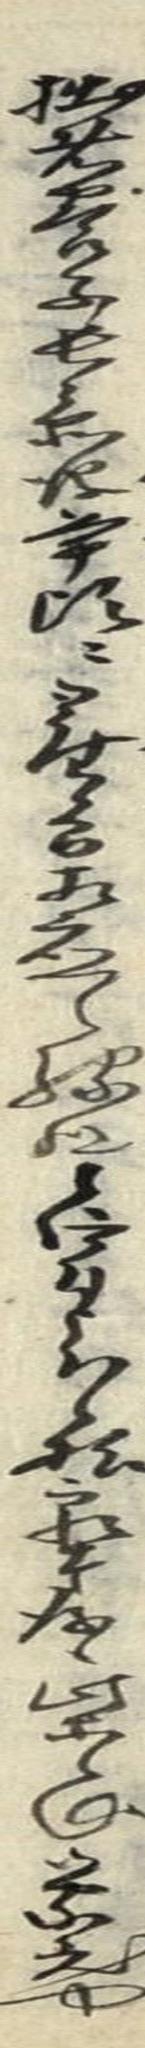拙者養子長兵衛儀年頃に御座候間相応之縁組被仰付被下候様願奉存候此等之趣御家老中
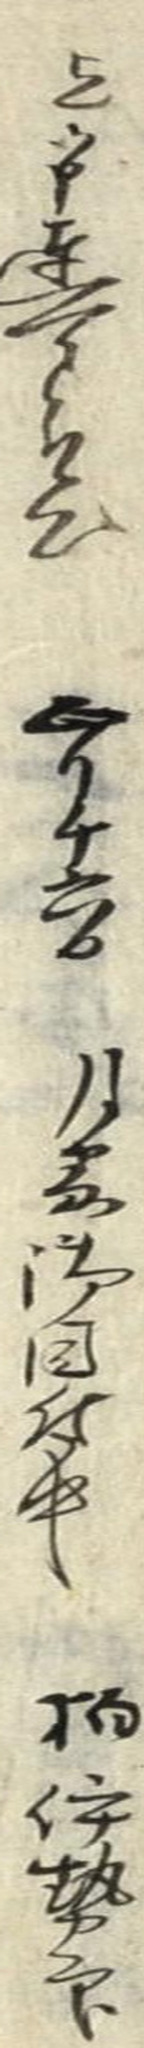迄御申達可被下候以上正月十六日月番御目付中柏伊勢印
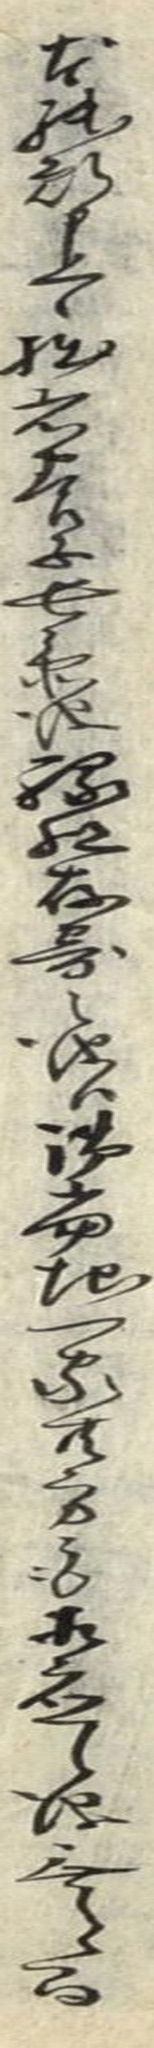本紙願申上候拙者養子長兵衛儀縁組存寄之儀は御当地一家共方にも相応之儀無之候間
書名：養子縁組之部
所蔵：福井県文書館 Fukui Prefectural Archives
